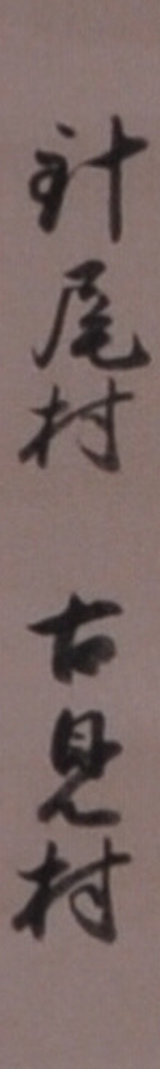針尾村古見村
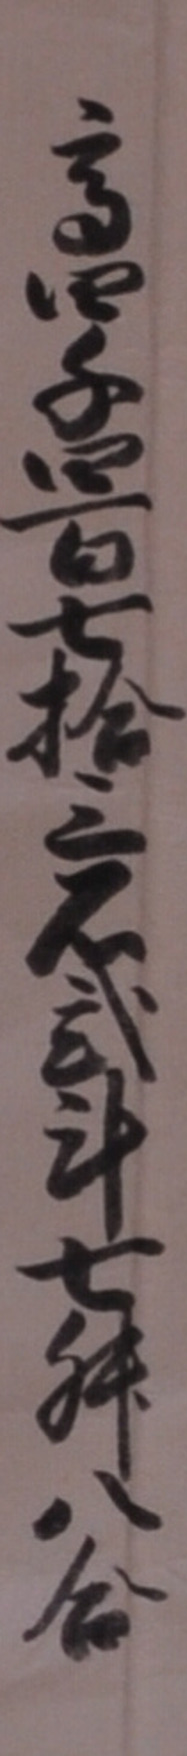高四千四百七拾三石弐斗七升八合
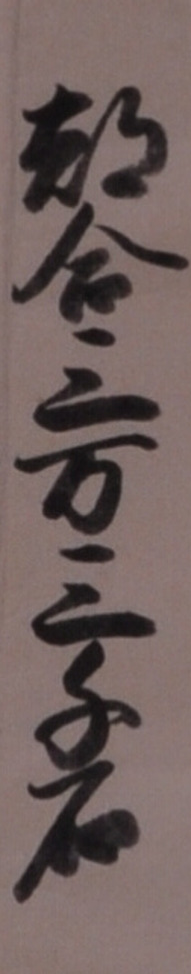都合三万三千石
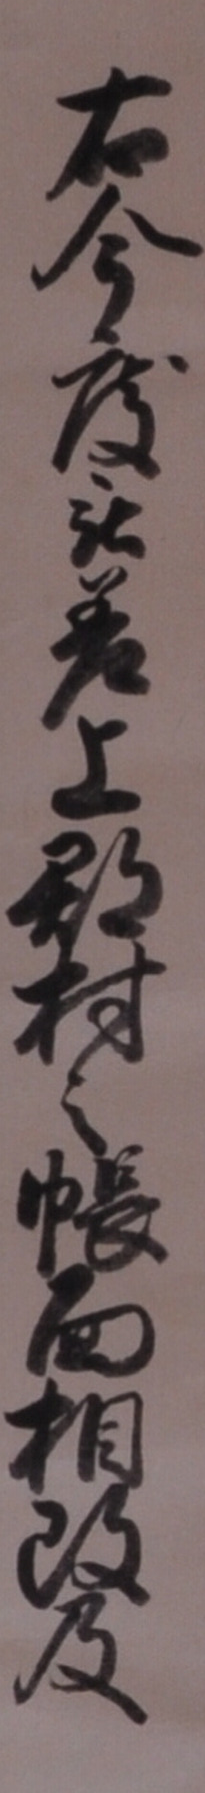右今度被差上郡村之帳面相改及
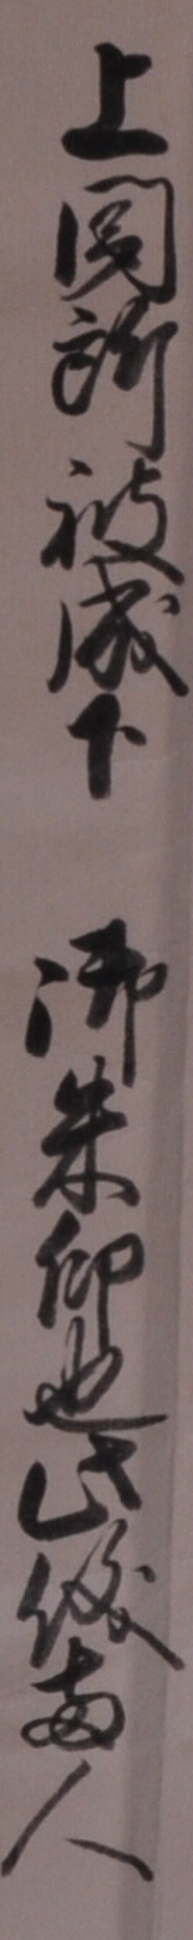上聞所被成下御朱印也此儀両人
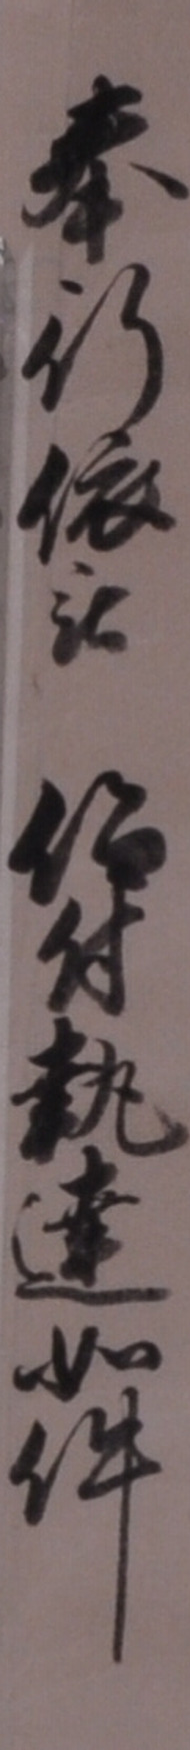奉行依被仰付執達如件

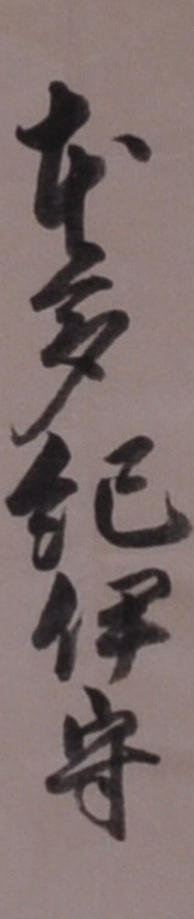本多紀伊守
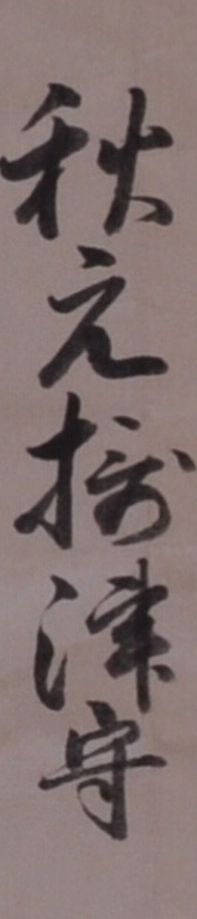秋元摂津守
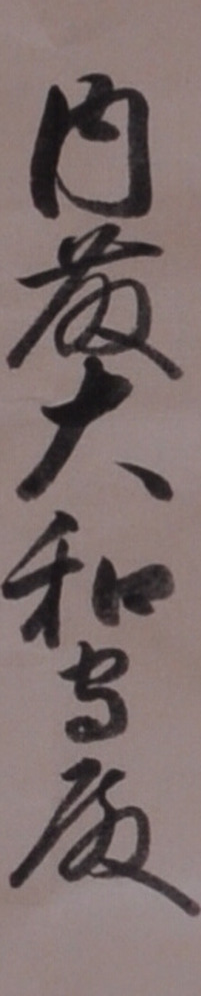内藤大和守殿
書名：御朱印写・領地目録写
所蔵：伊那市立高遠町図書館・合同会社AMANE
